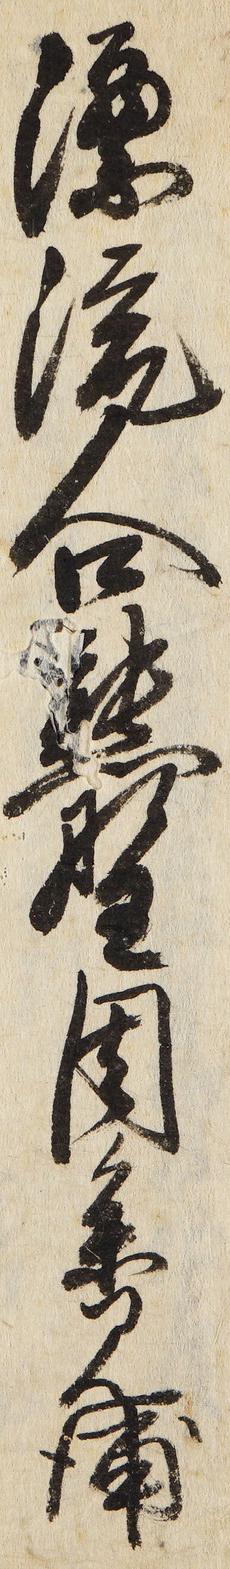漂流人口熊野周参見浦
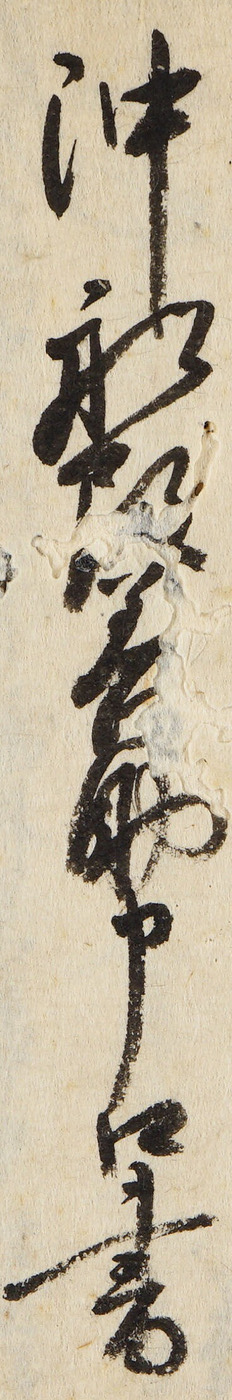沖船頭善助申口書

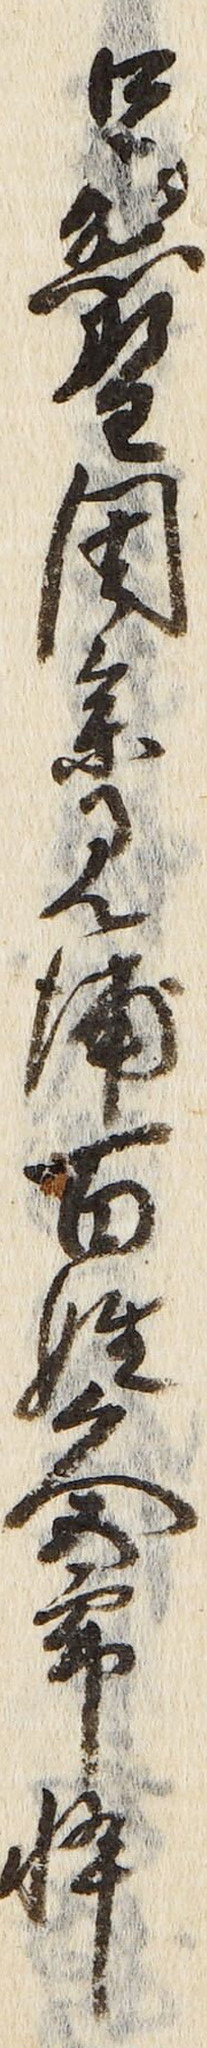口熊野周参見浦百姓久五郎伜
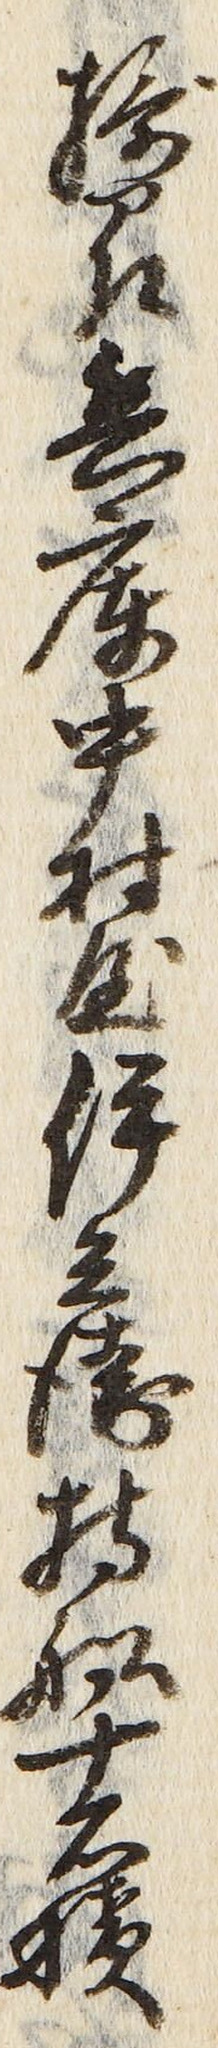摂州兵庫中村屋伊兵衛持舩千石積
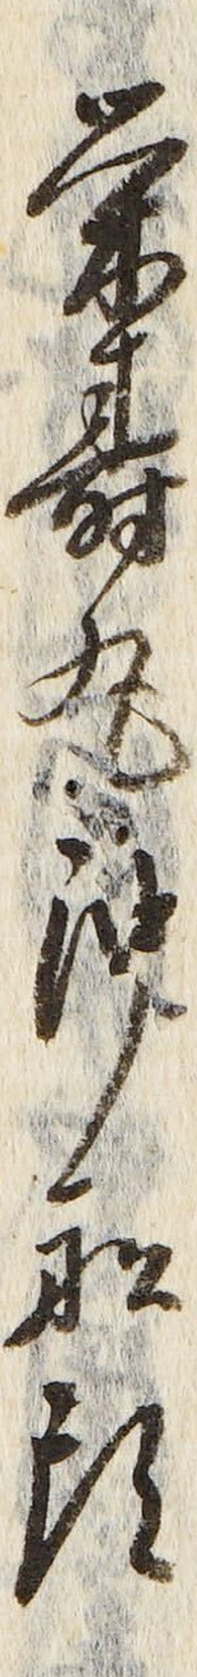栄壽丸沖船頭
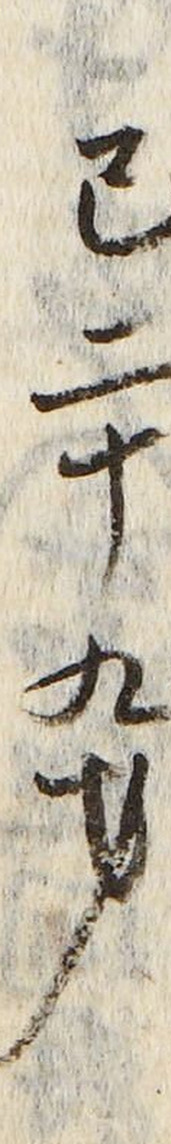巳二十九才
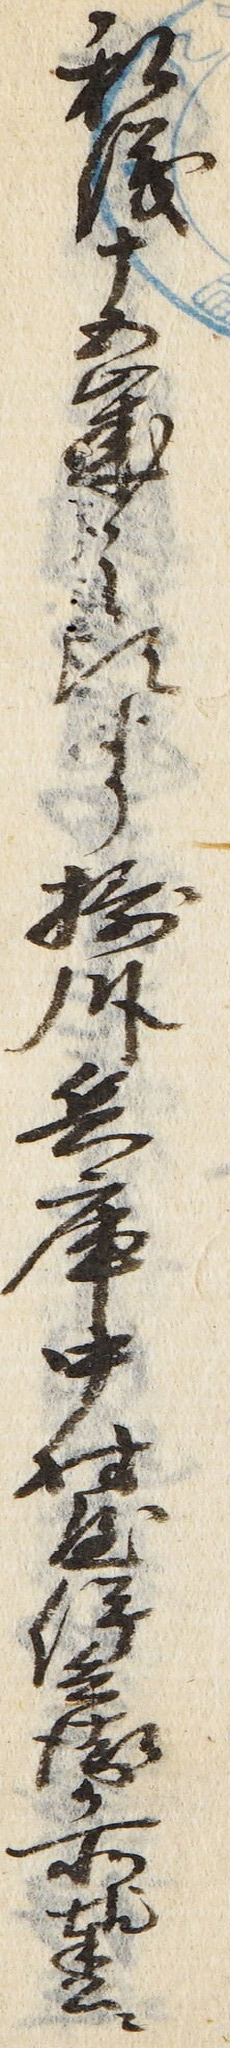私儀十五歳之比より摂州兵庫中村屋伊兵衛か所江奉公ニ
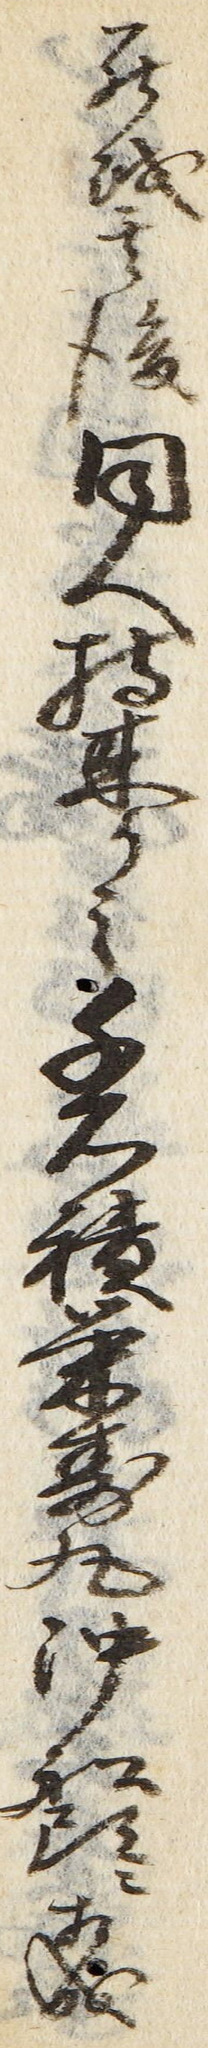罷越其後同人持来り之千石積栄壽丸沖船頭ニ相成
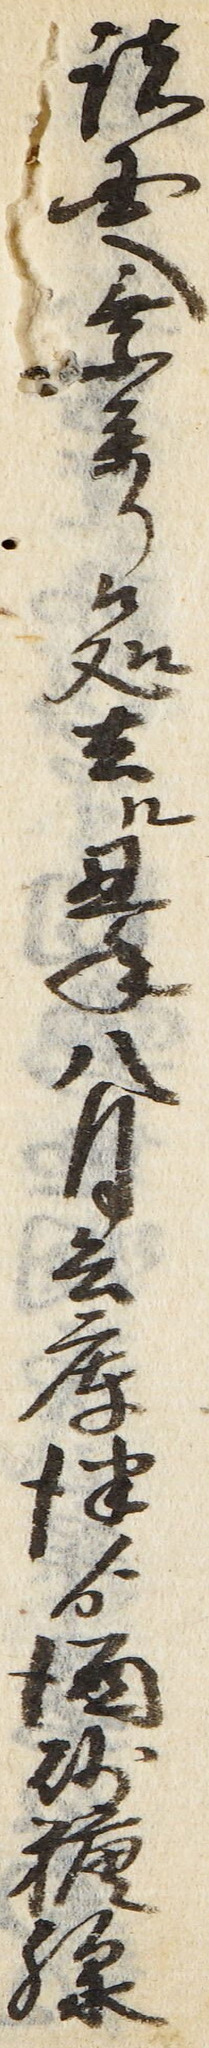諸国へ乗参り候処去ル丑年八月兵庫津ゟ酒砂糖線
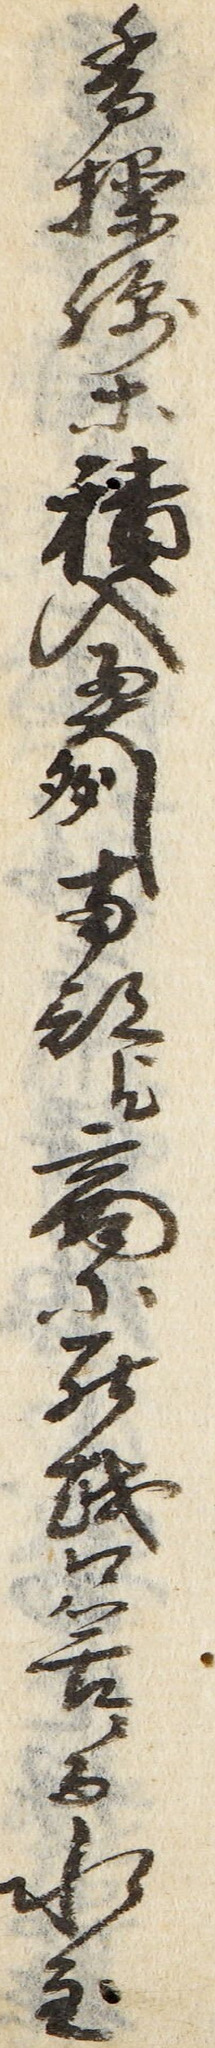香操綿等積入奥州南部江商に罷越候筈ニ而水主

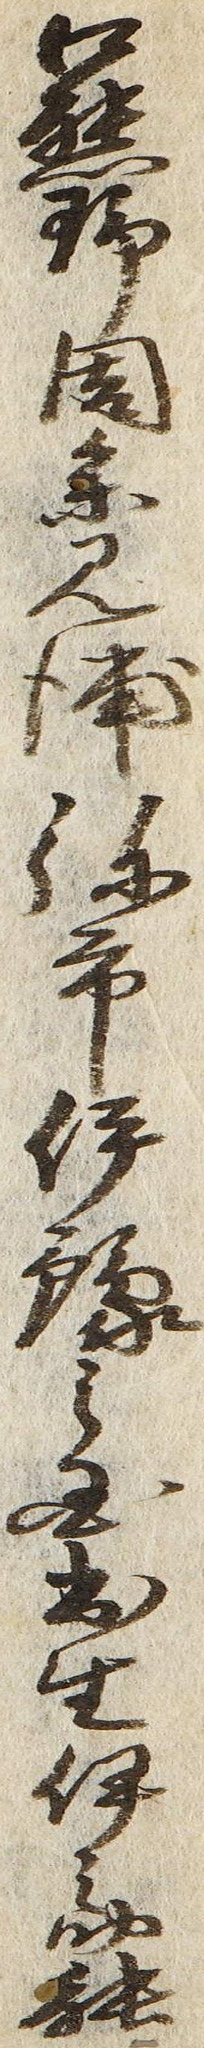口熊野周参見浦弥市伊豫之国出生伊之助能
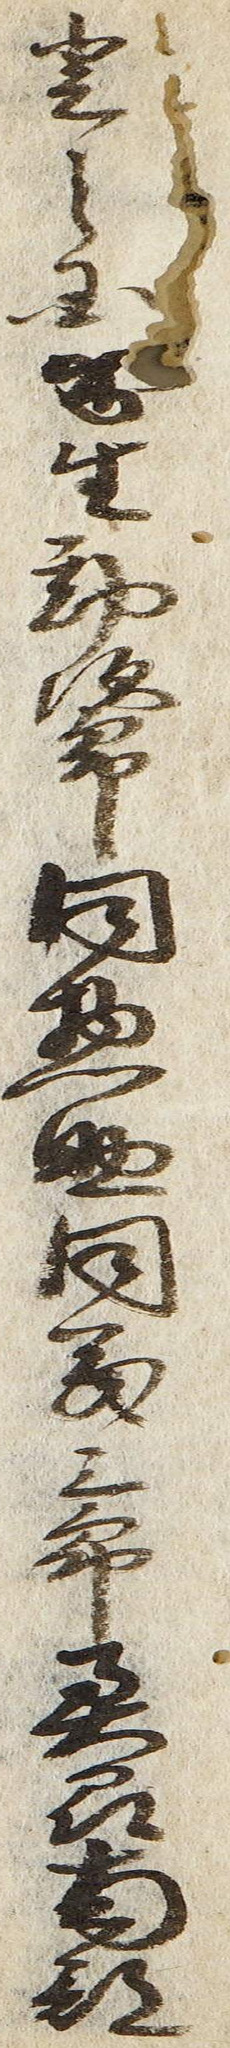登之国出生勘次郎同惣助同茂三郎奥州南部
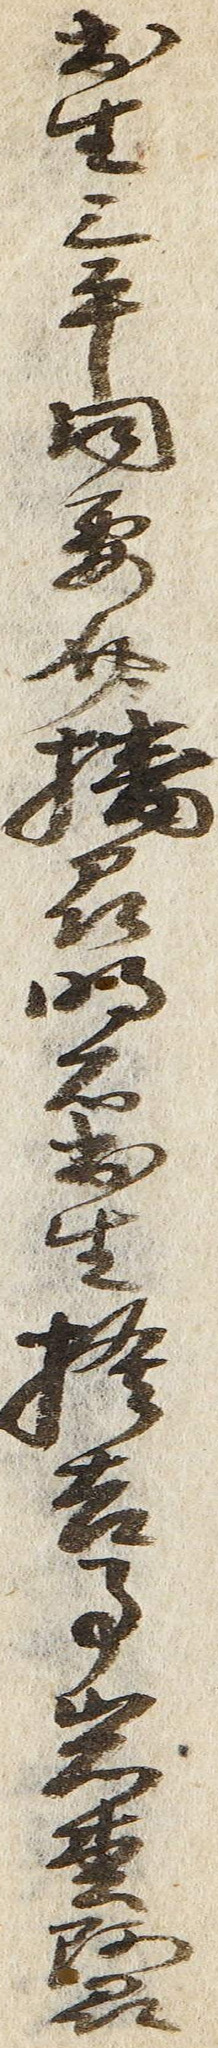出生三平同要介播州明石出生捨吉事岩枩阿州
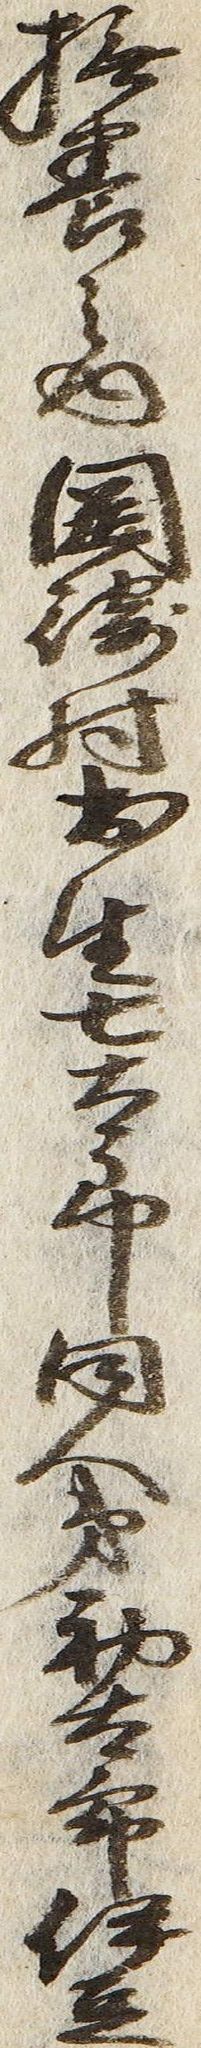撫養之岡崎村出生七太郎同人弟初太郎伊豆
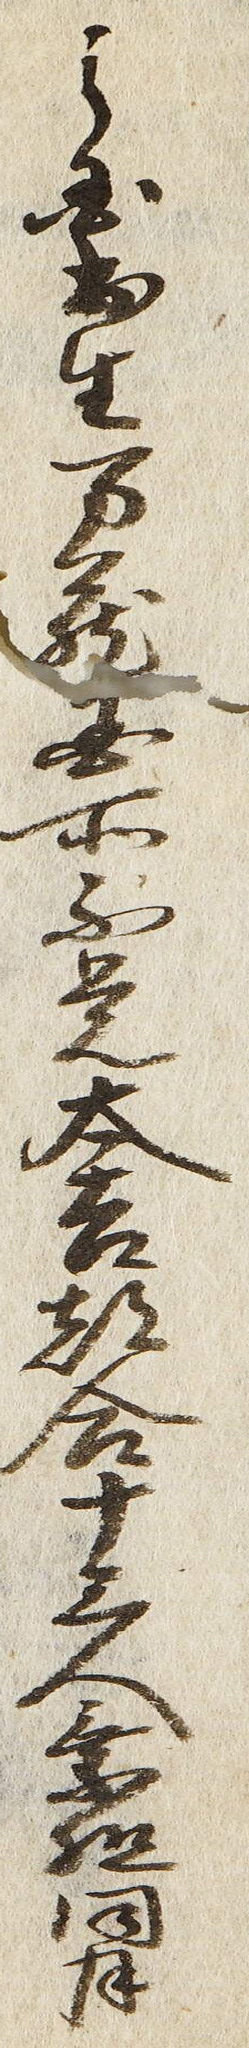之国出生万蔵国所不覚太吉都合十三人乗組同月
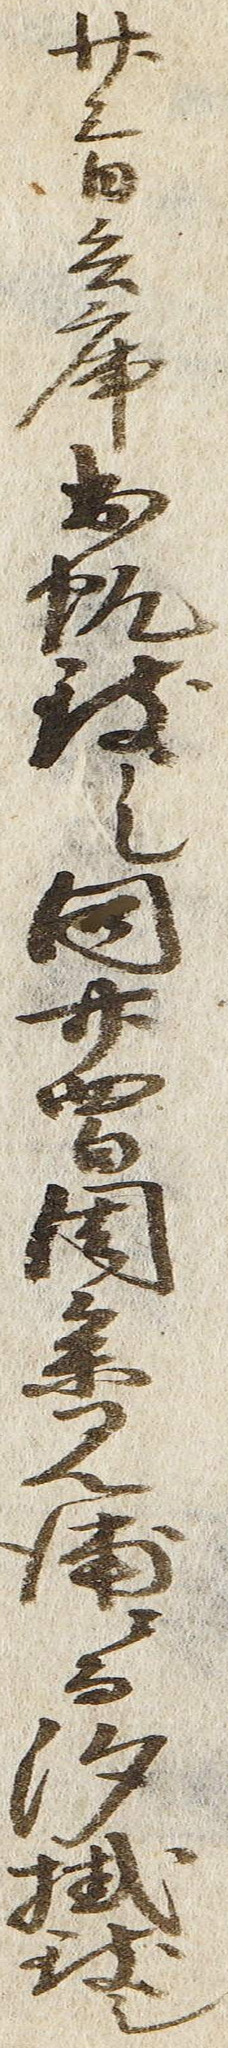廿三日兵庫出帆致し同廿四日周参見浦ニ而汐掛致シ
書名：漂流人善助聞書
